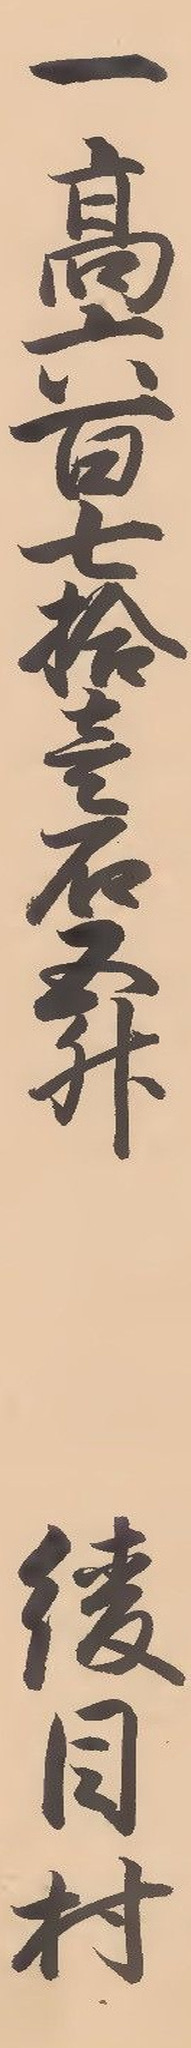一高六百七拾壱石五升綾目村

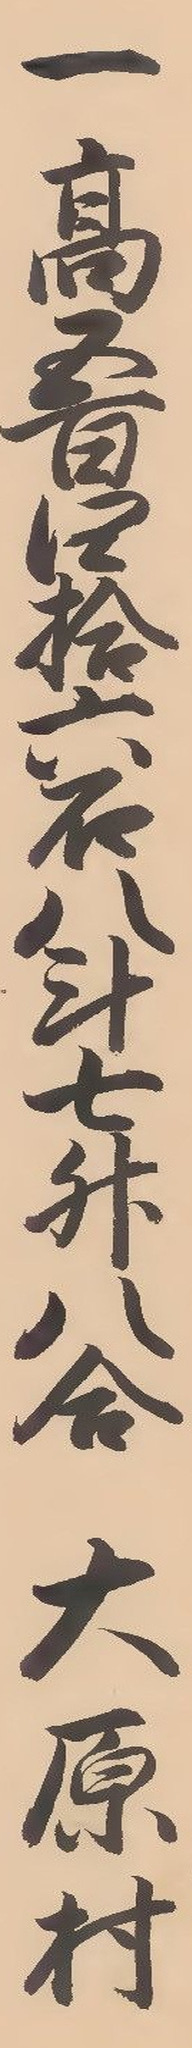一高五百四拾六石八斗七升八合大原村
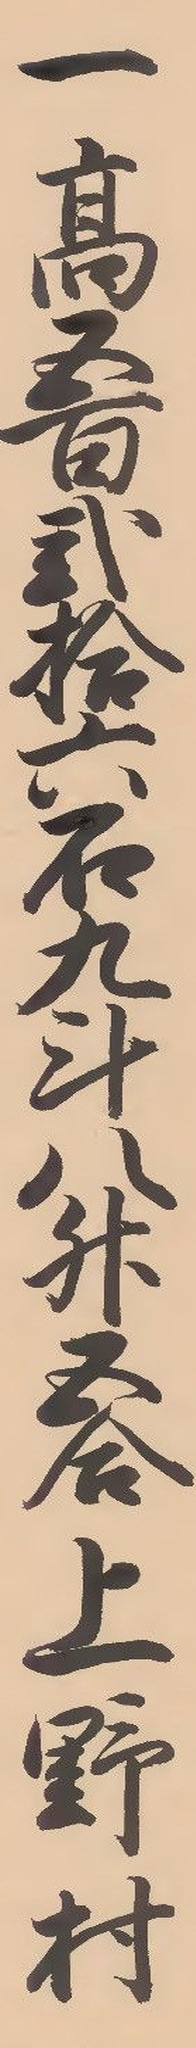一高五百弐拾六石九斗八升五合上野村
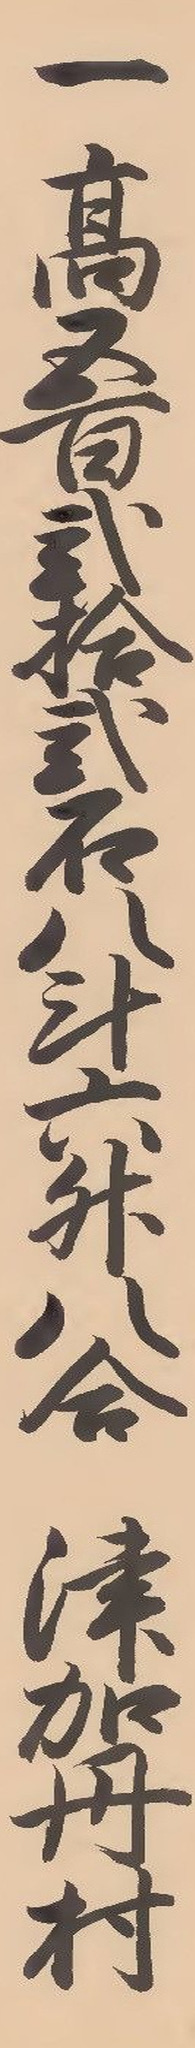一高五百弐拾弐石八斗六升八合津加丹村
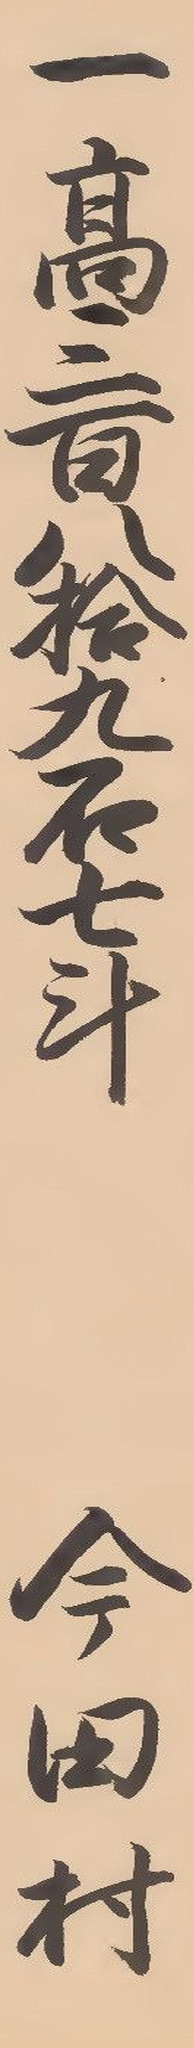一高三百八拾九石七斗今田村
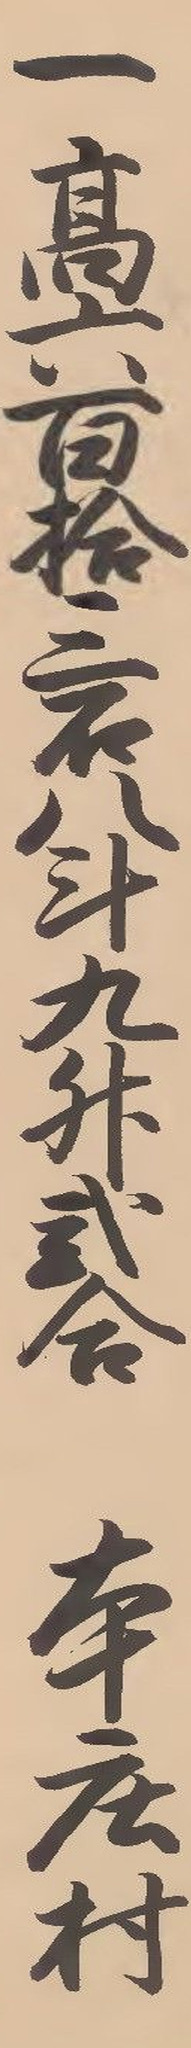一高六百拾三石八斗九升弐合本庄村
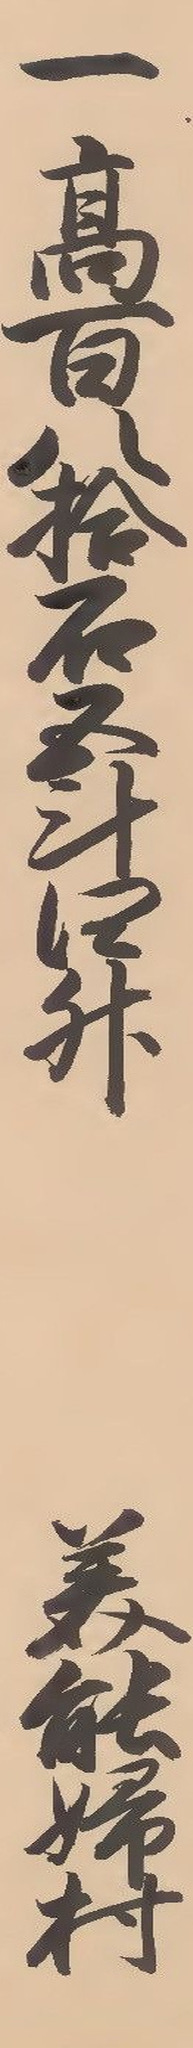一高百八拾石五斗四升美能婦村
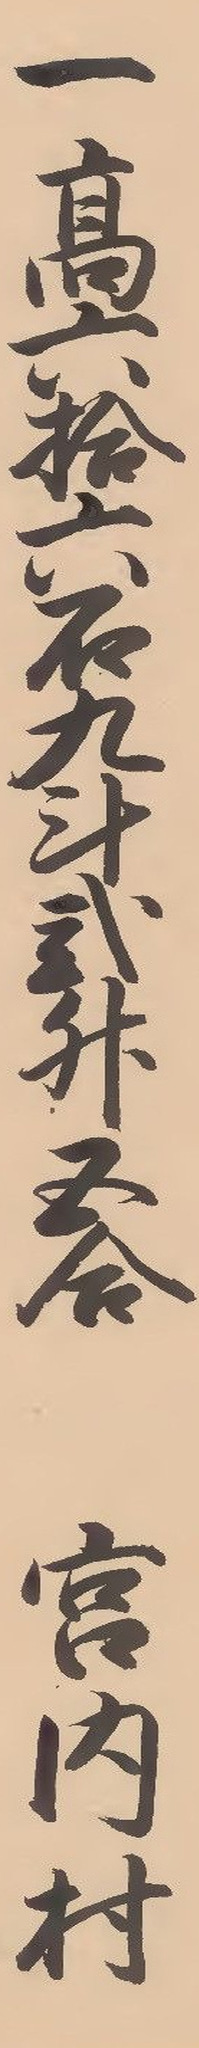一高六拾六石九斗弐升五合宮内村
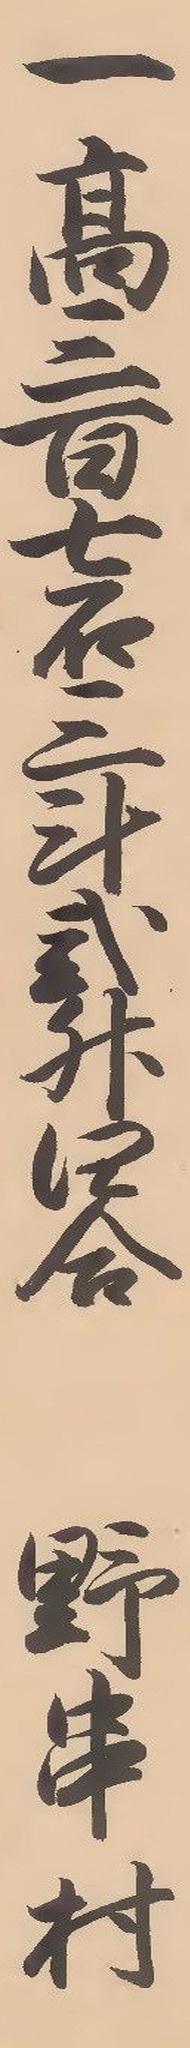一高三百七石三斗弐升四合野串村

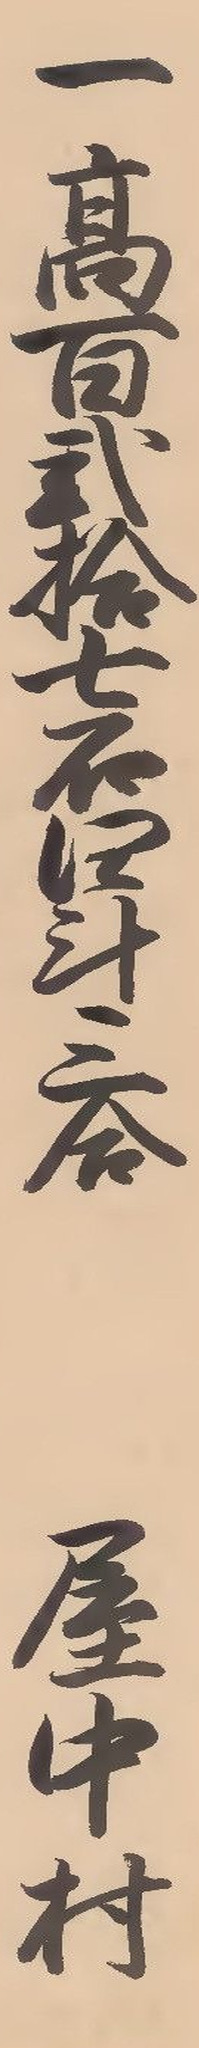一高百弐拾七石四斗三合屋中村
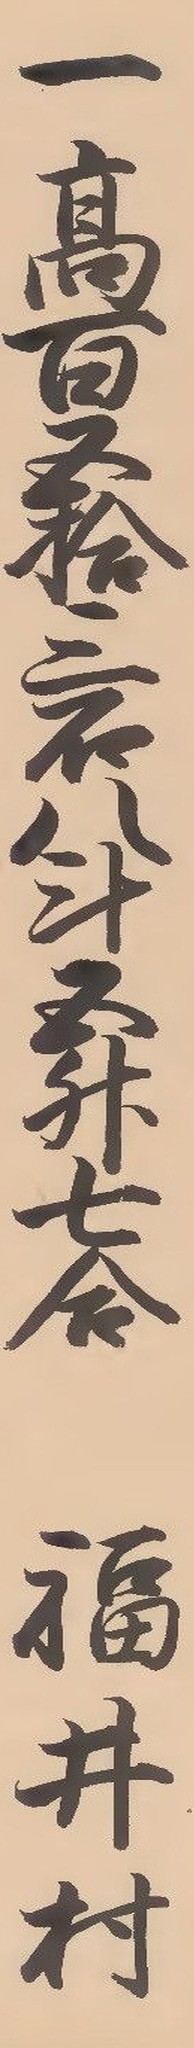一高百五拾三石八斗五升七合福井村
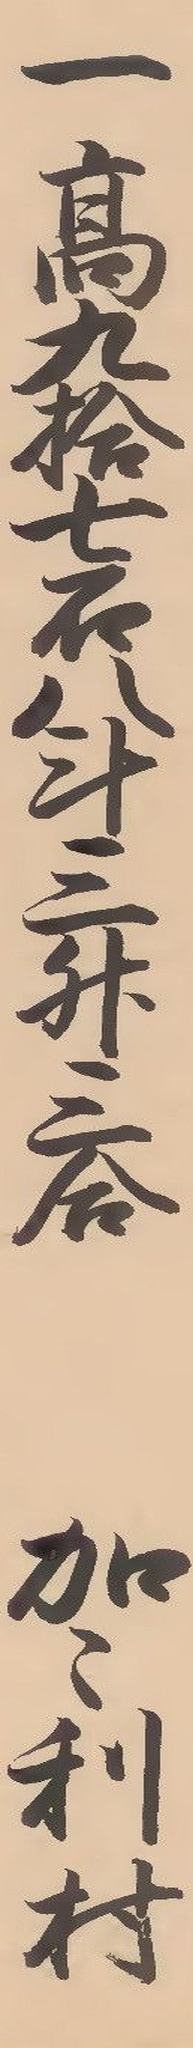一高九拾七石八斗三升三合加々利村
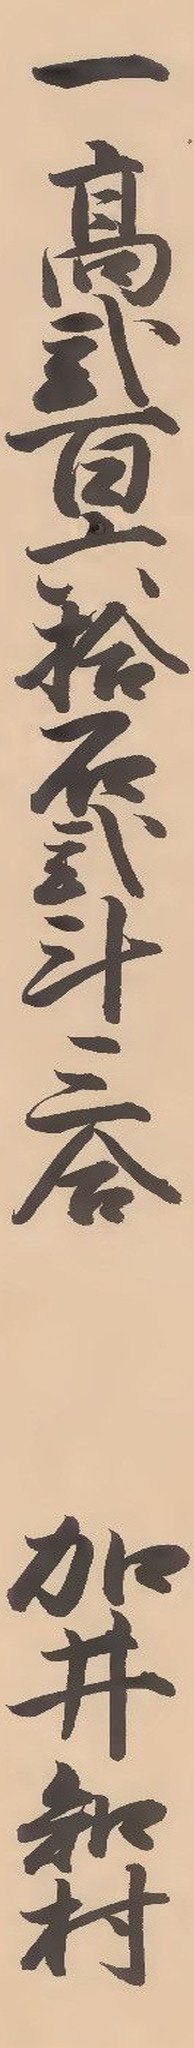一高弐百六拾石弐斗三合加井知村
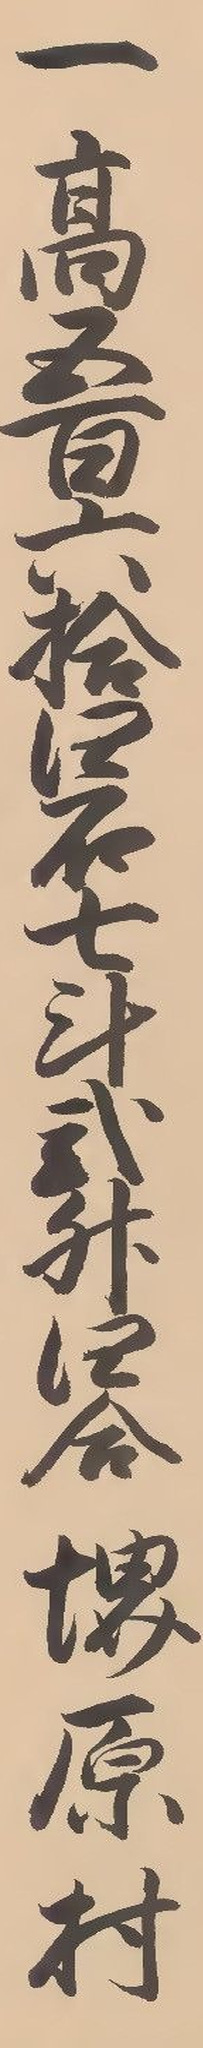一高五百六拾四石七斗弐升四合堺原村
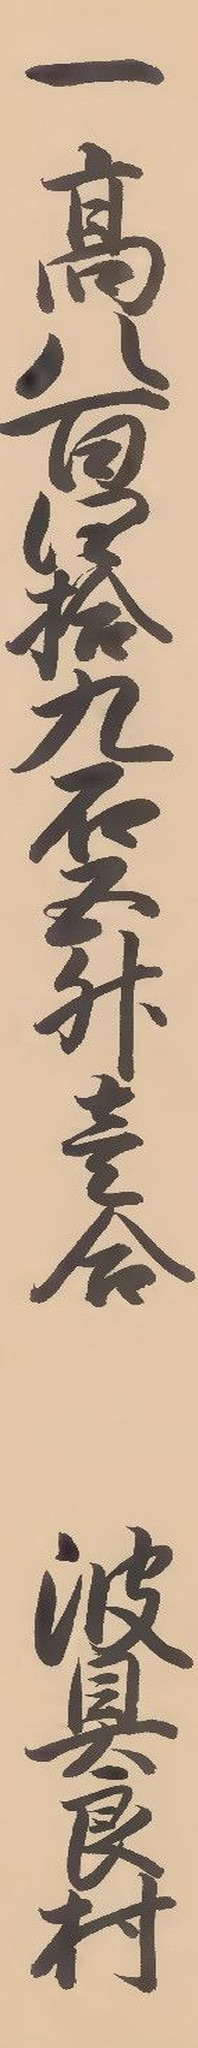一高八百四拾九石五升壱合波具良村
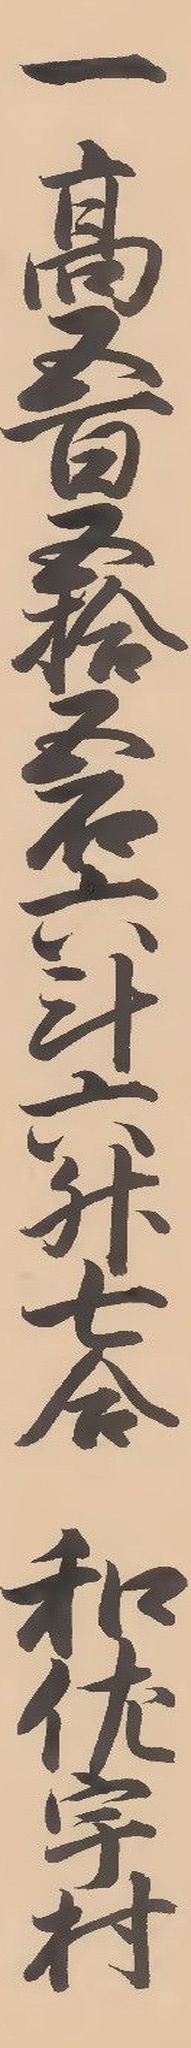一高五百五拾五石六斗六升七合和佐宇村
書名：備後国郷帳
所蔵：国立公文書館 National Archives of Japan
